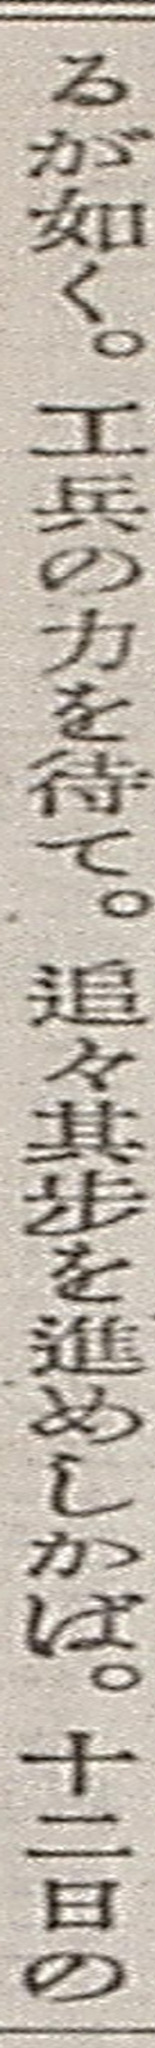るが如く。工兵の力を待て。追々歩を進めしかば。十二日の
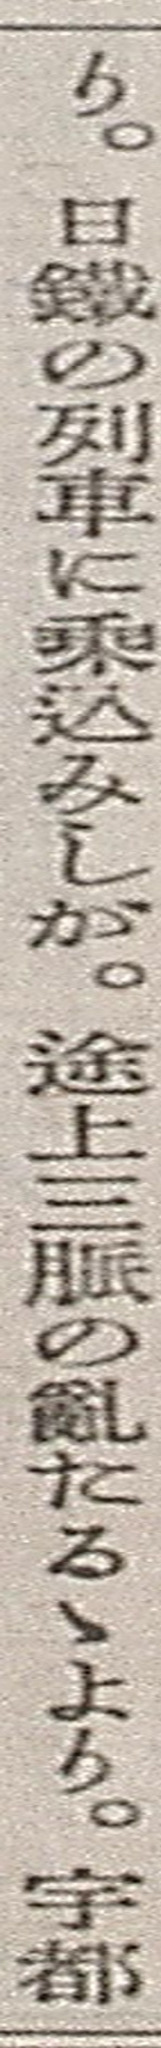り。日鉄の列車に乗込みしが。途上三脈の乱たるゝより。宇都
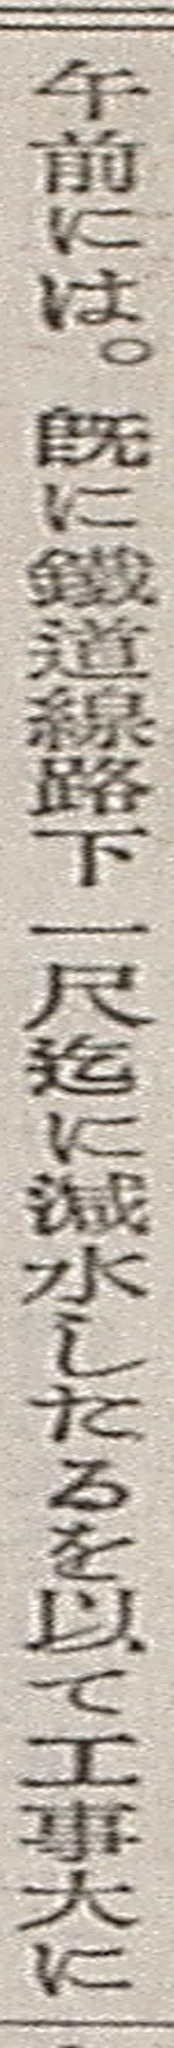午前には。既に鉄道線路下一尺迄に減水したるを以て工事大に
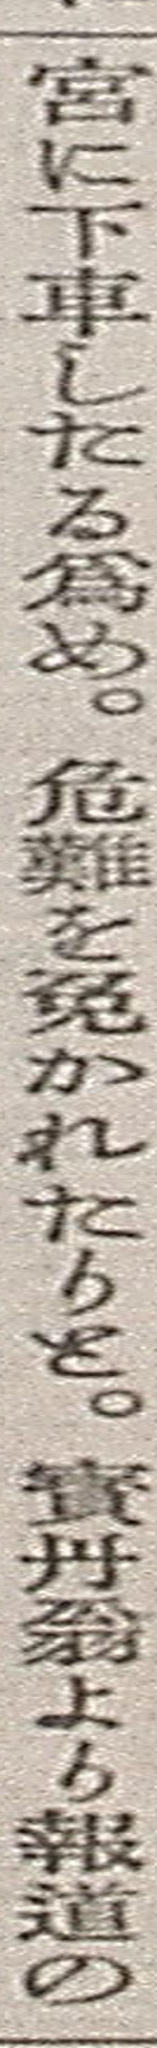宮に下車したる為め。危難を免かれたりと。宝丹翁より報道の
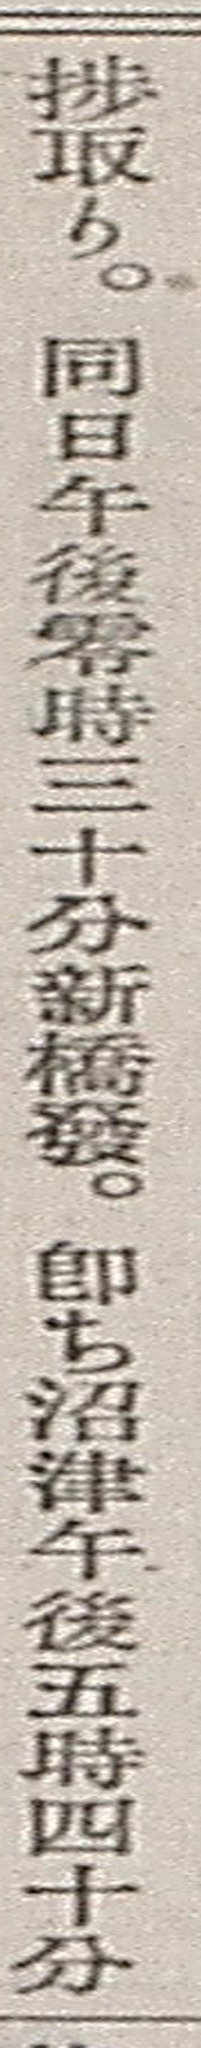捗取り。同日午後零時三十分新橋発。即ち沼津午後五時四十分
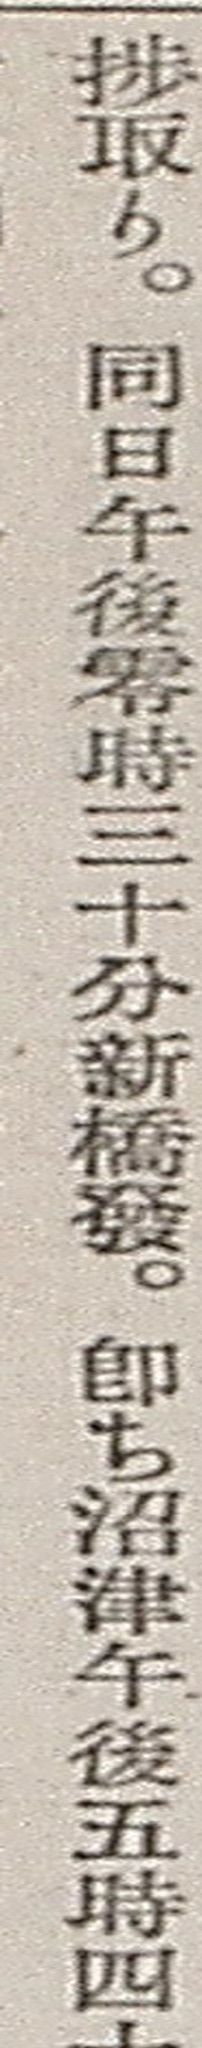捗取り。同日午後零時三十分新橋発。即ち沼津午後五時四十分
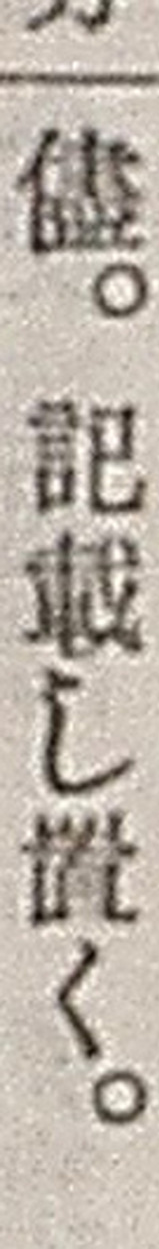侭。記載し置く。
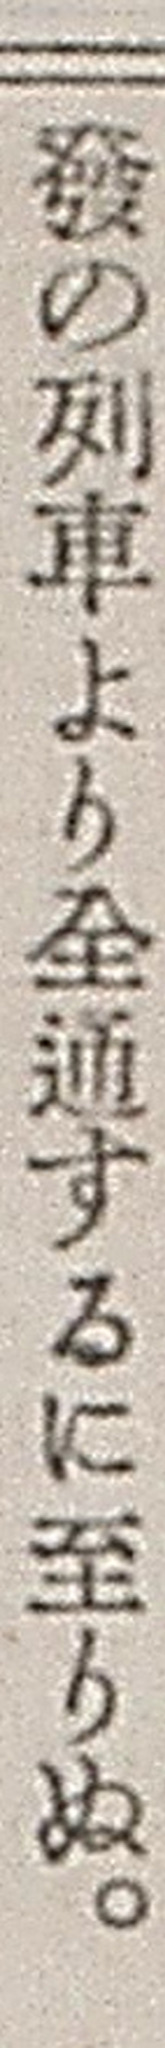発の列車より全通するに至りぬ。
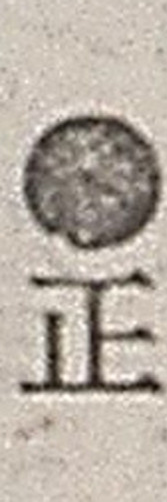●正誤
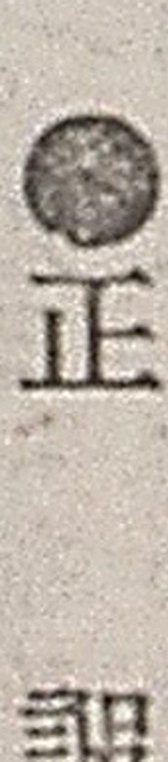●正誤
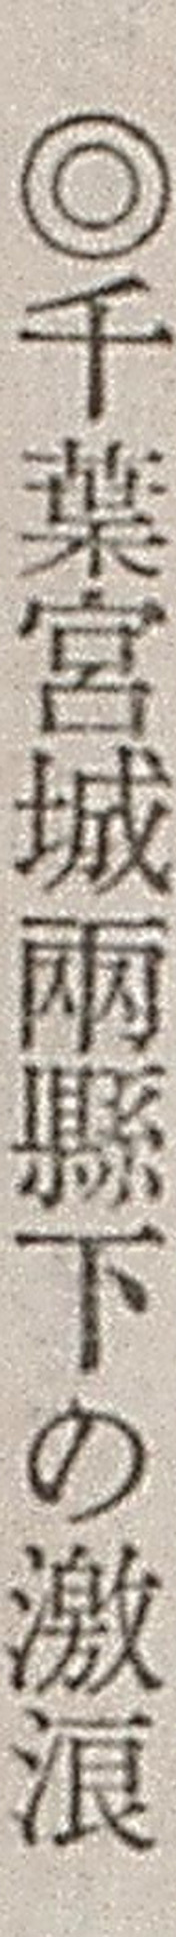◎千葉宮城両県下の激浪
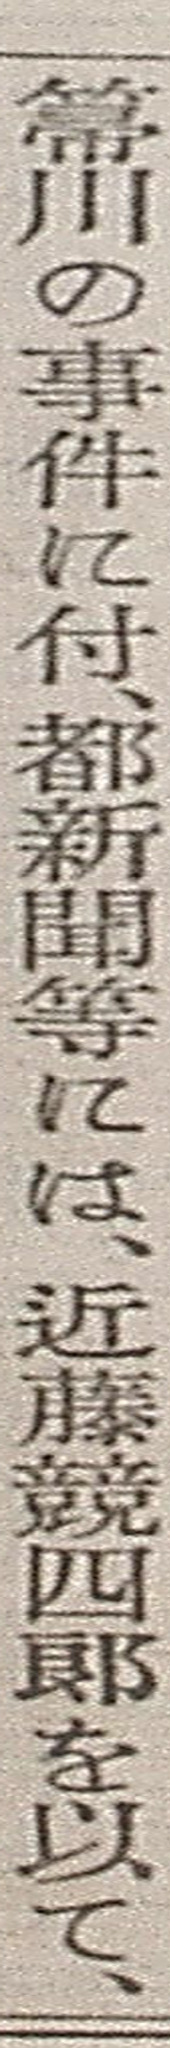箒川の事件に付、都新聞等には、近藤競四郎を以て、
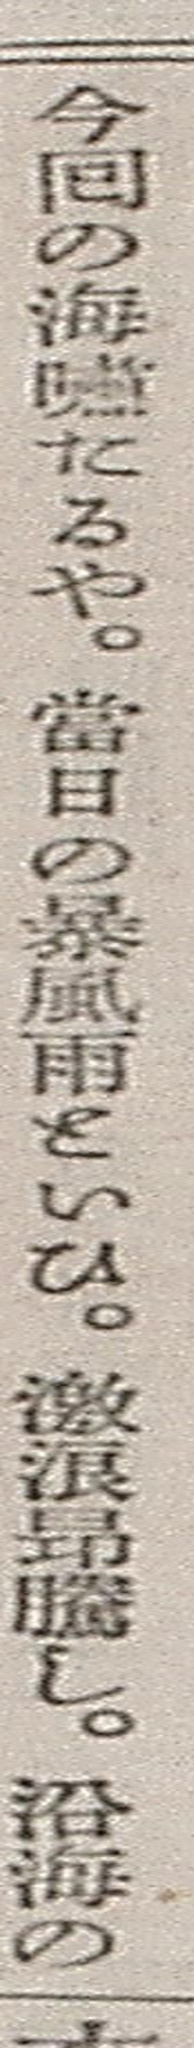今回の海嘯たるや。当日の暴風雨といひ。激浪昂騰し。沿海の
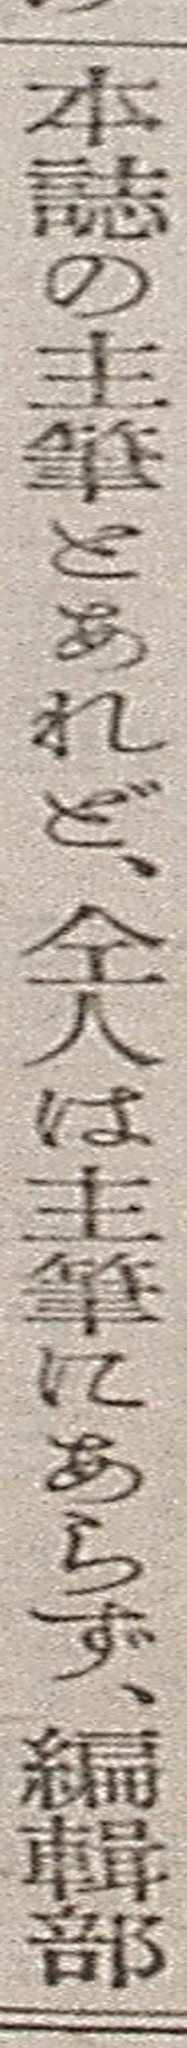本誌の主筆とあれど、仝人は主筆にあらず、編集部
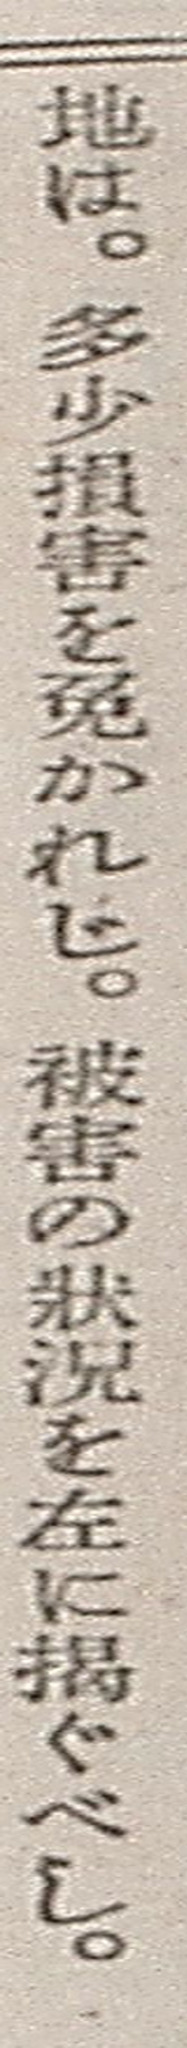地は。多少損害を免かれじ。被害の状況を左に揚ぐべし。
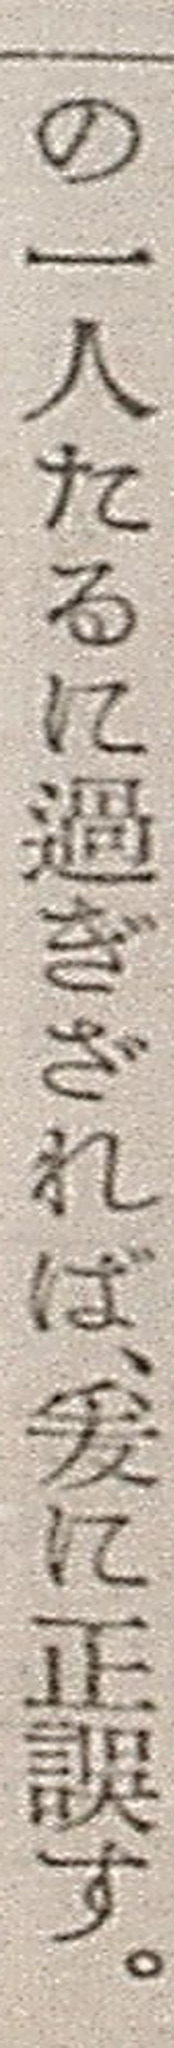の一人たるに過ぎざれば、爰に正誤す。
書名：風俗畫報臨時増刊第百九十九號　明治三十二年十月各地災害圖會（前編之續）
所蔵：東京大学地震研究所図書室 Earthquake Research Institute Library, The University of Tokyo, JAPAN
